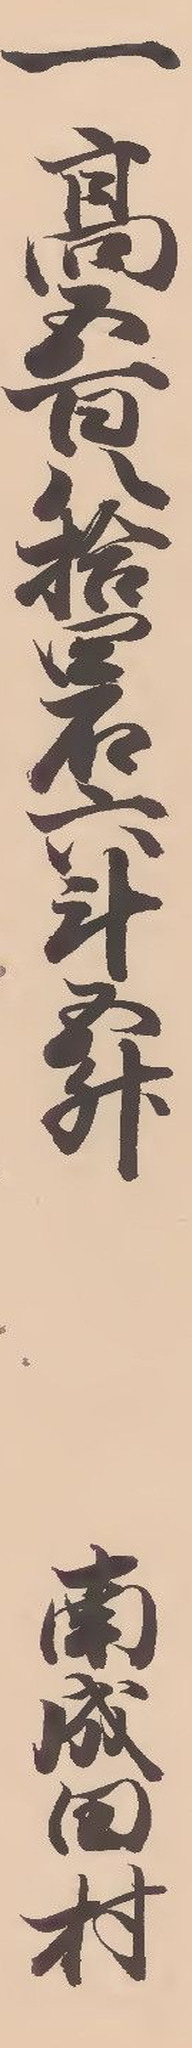一高五百八拾四石六斗五升南成田村

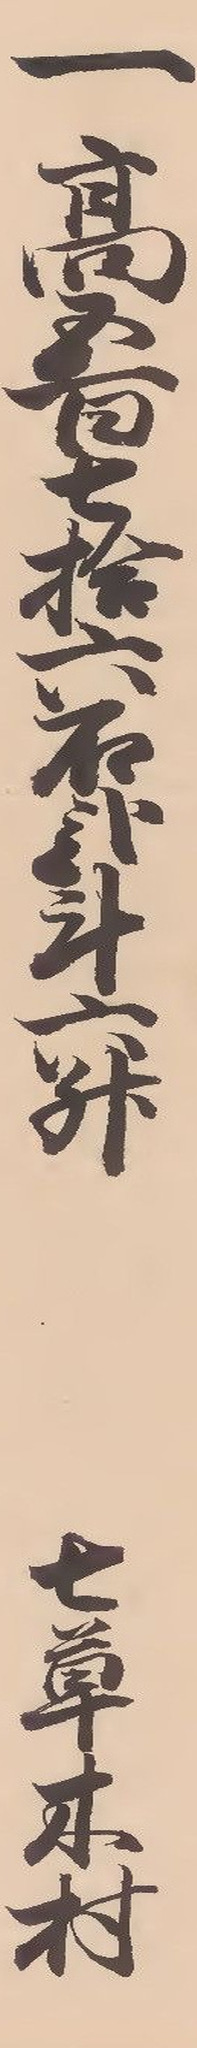一高五百七拾六石弐斗六升七草木村
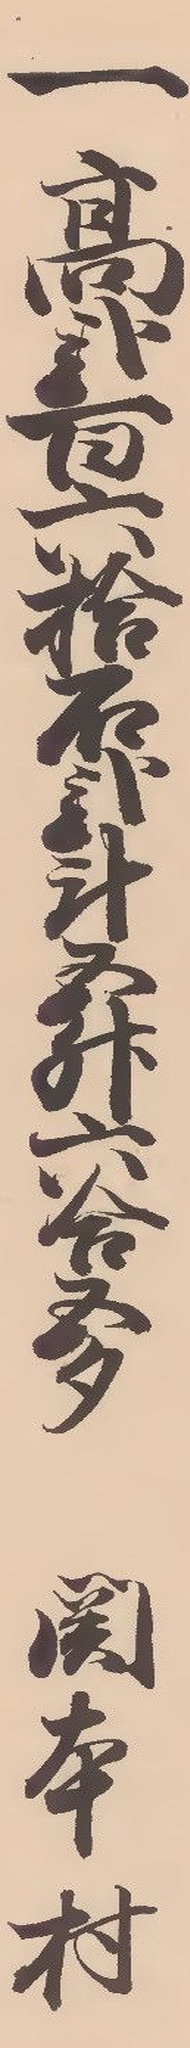一高弐百六拾石弐斗五升六合五勺関本村
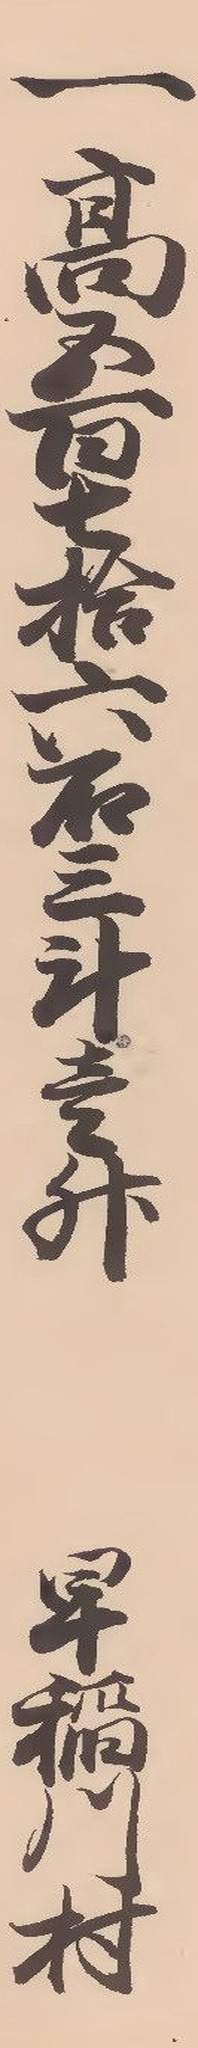一高五百七拾六石三斗壱升早稲川村
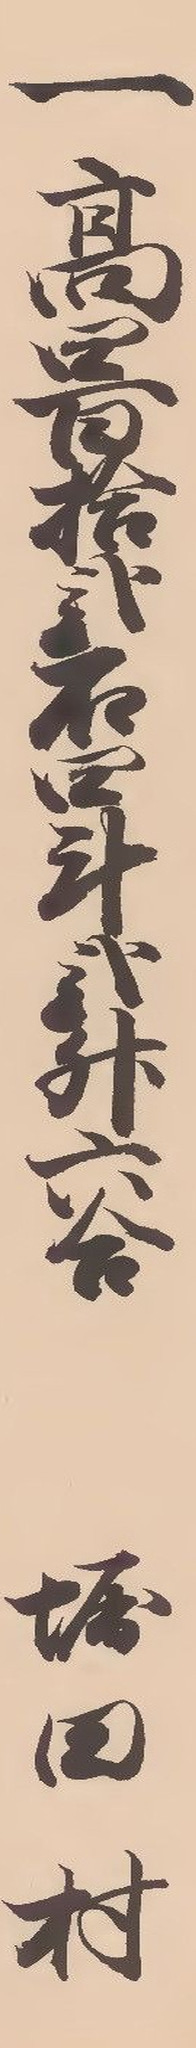一高四百拾弐石四斗弐升六合堀田村
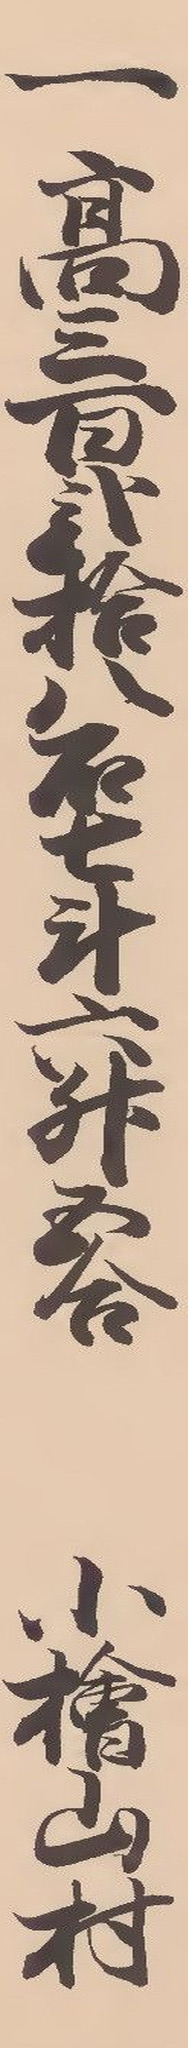一高三百弐拾八石七斗六升五合小桧山村
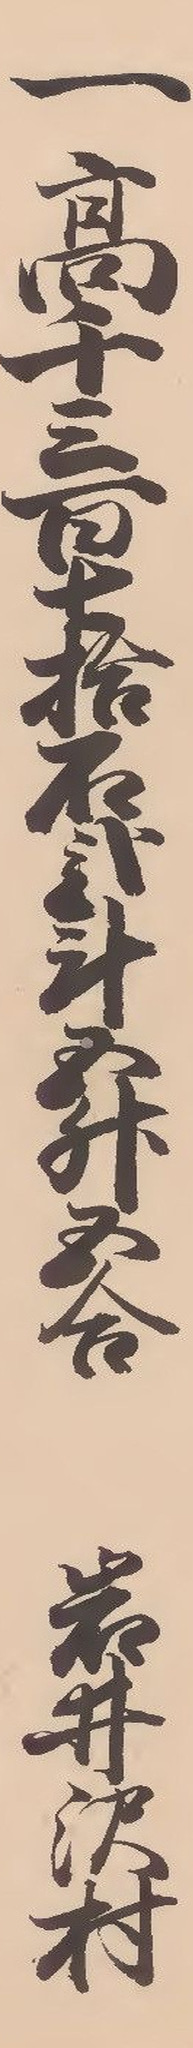一高千三百七拾石弐斗五升五合岩井沢村
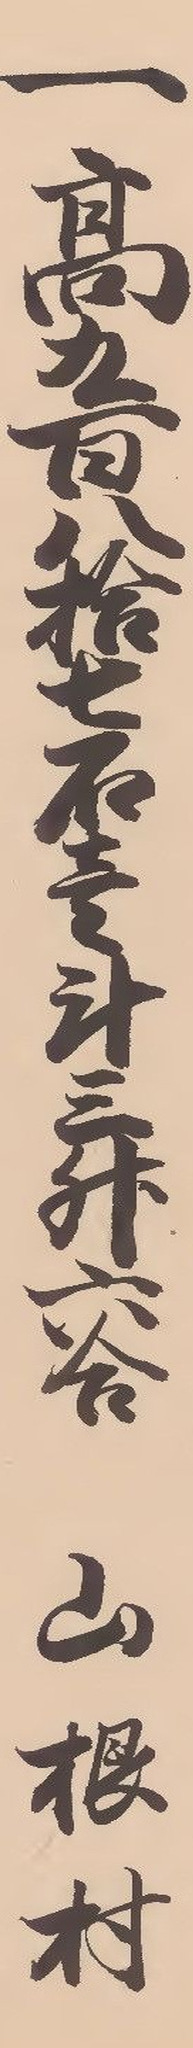一高九百八拾七石壱斗三升六合山根村
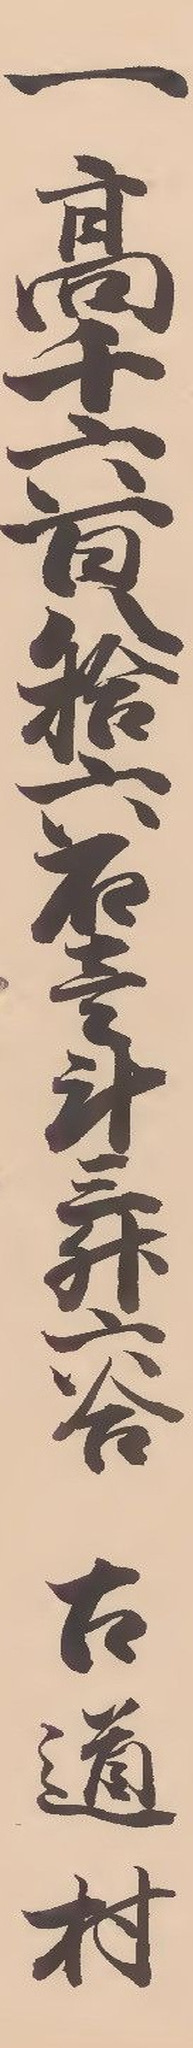一高千六百八拾六石壱斗三升六合古道村

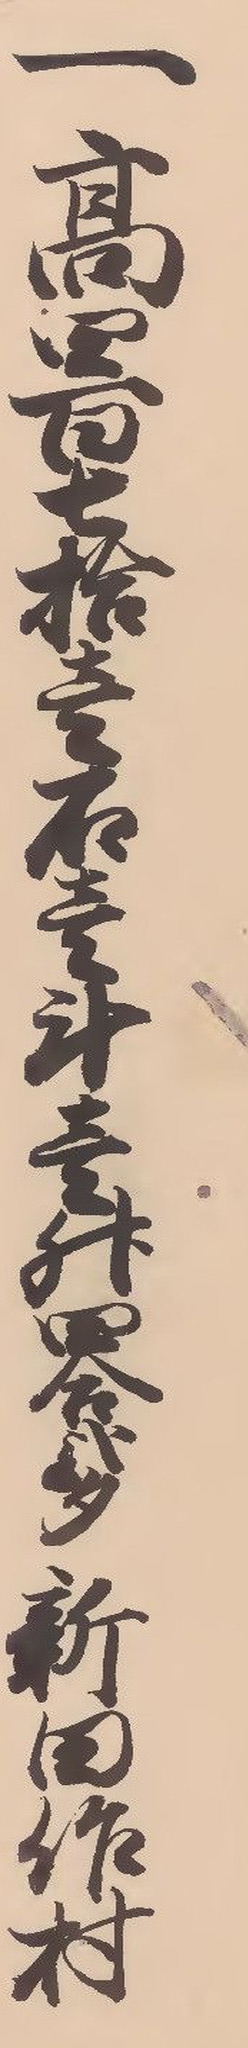一高四百七拾壱石壱斗壱升四合弐勺新田作村
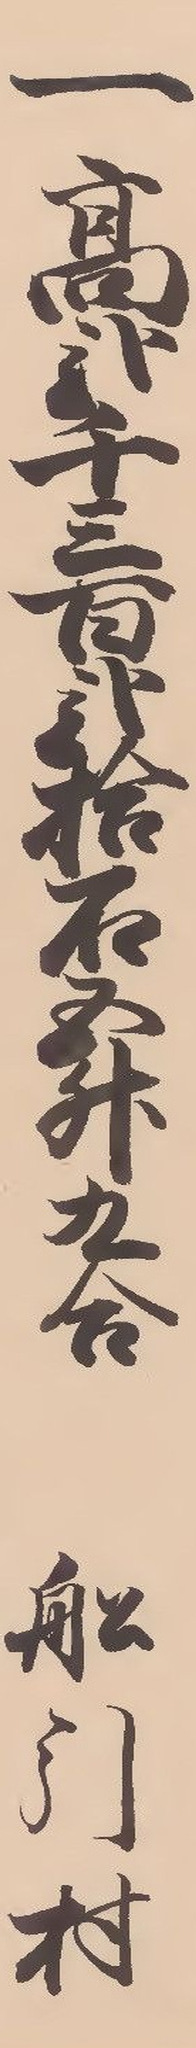一高弐千三百弐拾石五升九合船引村
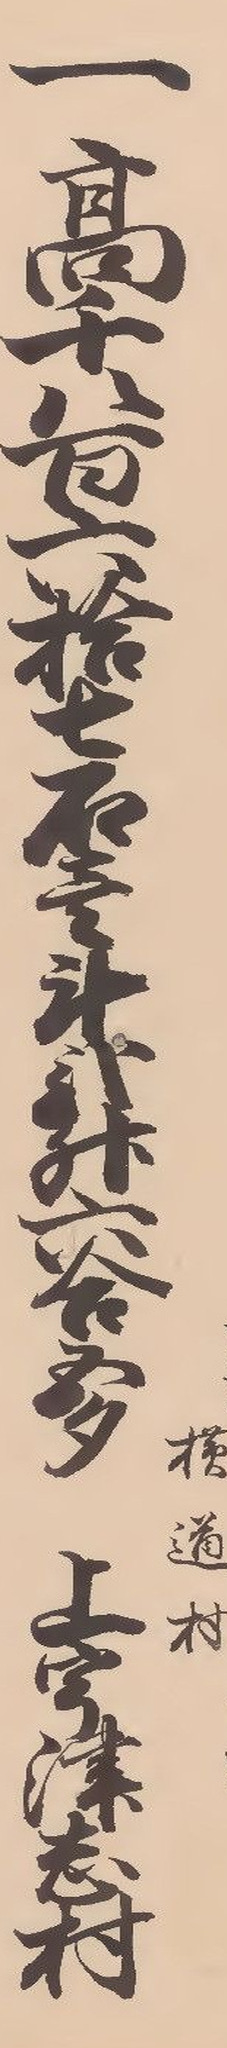一高千八百六拾七石壱斗弐升六合五勺上宇津志村
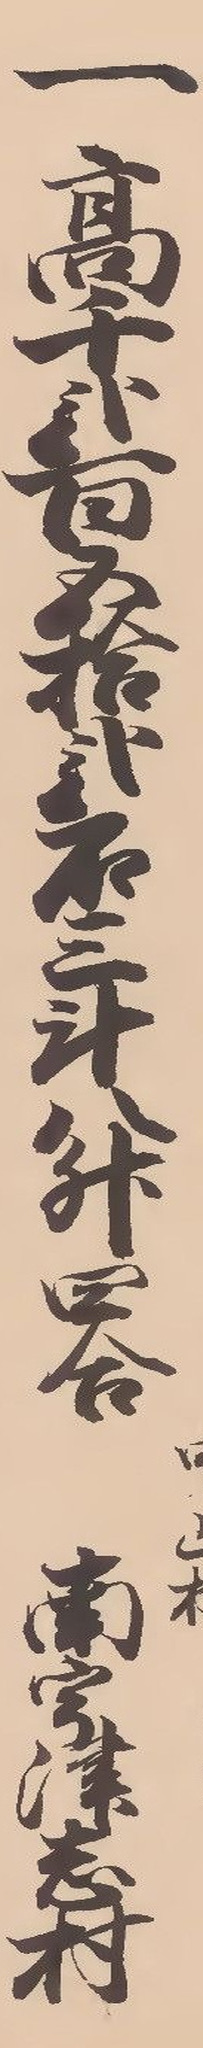一高千弐百五拾弐石三斗八升四合南宇津志村
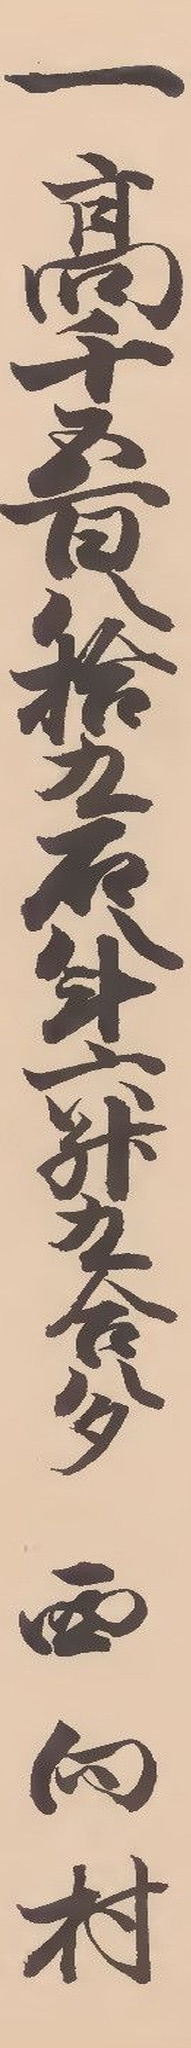一高千五百八拾九石八斗六升九合八勺西向村
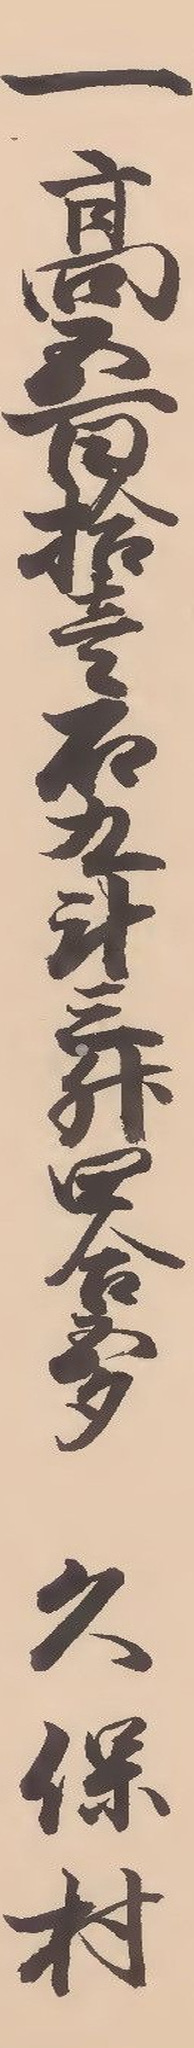一高五百拾壱石九斗三升四合五勺久保村
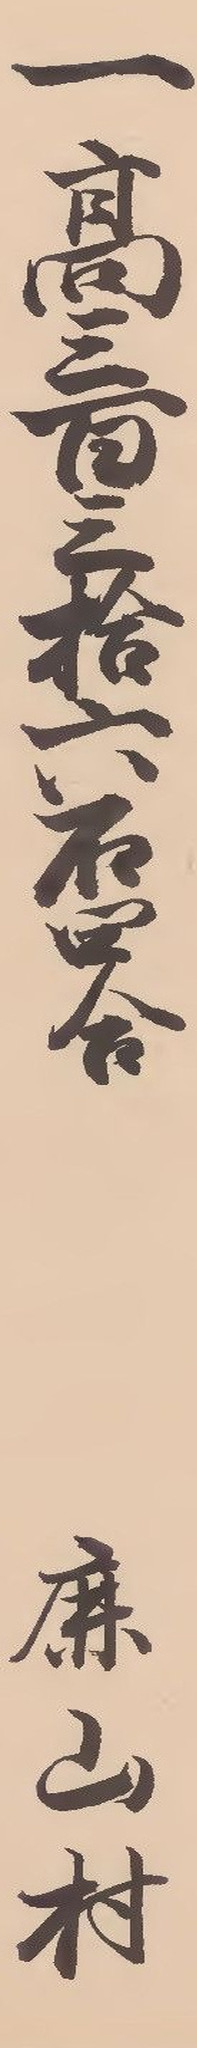一高三百三拾六石四合鹿山村
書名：陸奥国郷帳　２
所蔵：国立公文書館 National Archives of Japan
